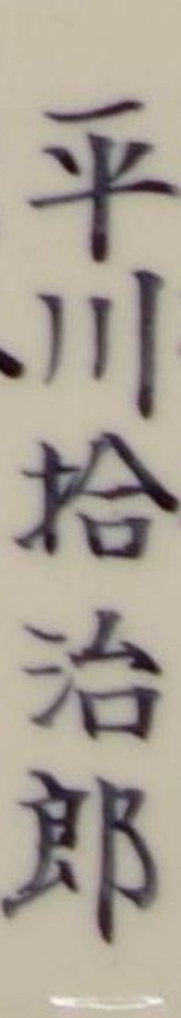平川拾治郎
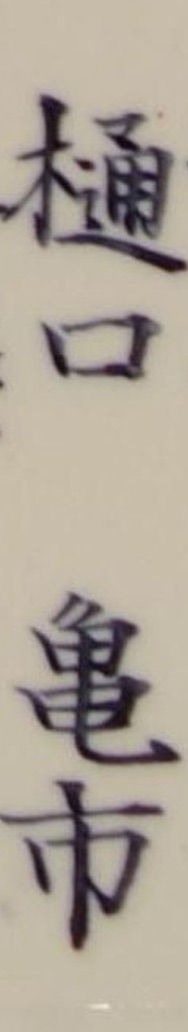樋口亀市
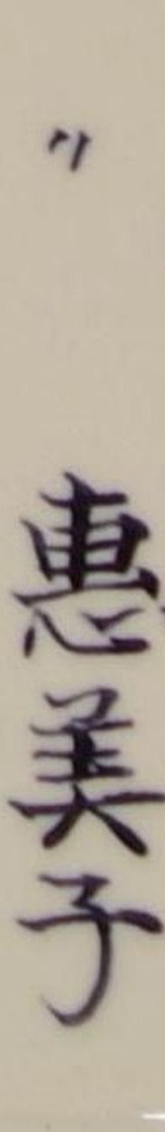恵美子
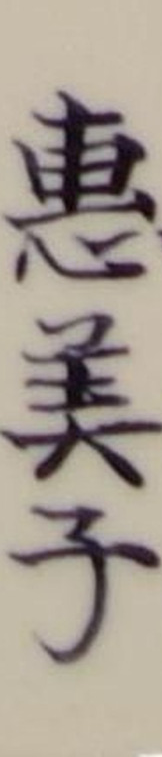恵美子
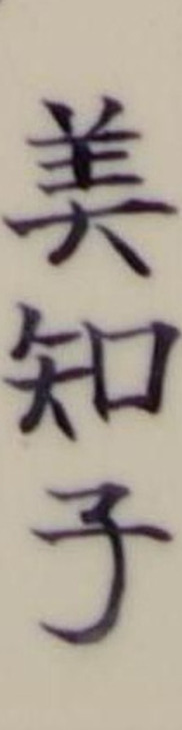美知子
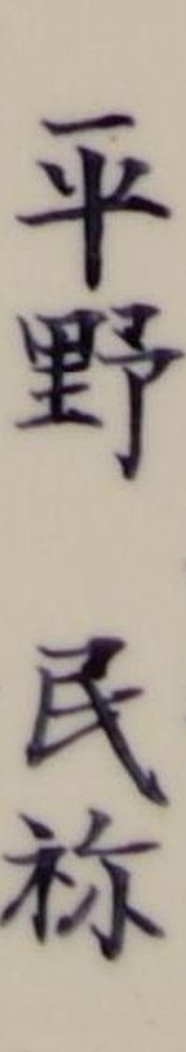平野民祢
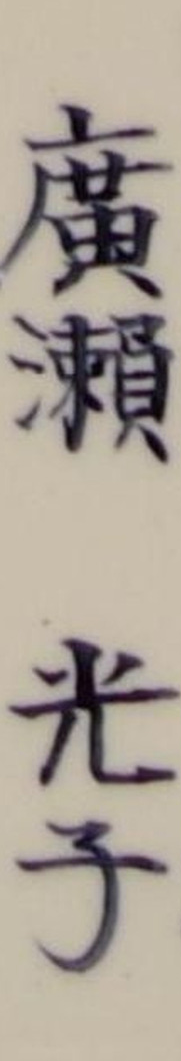廣瀬光子
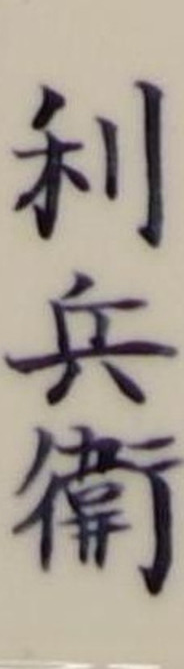利兵衛
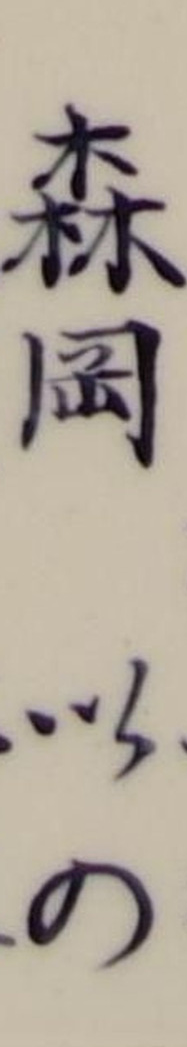森岡いの
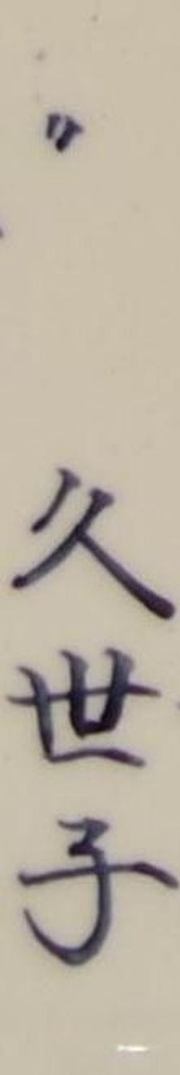久世子
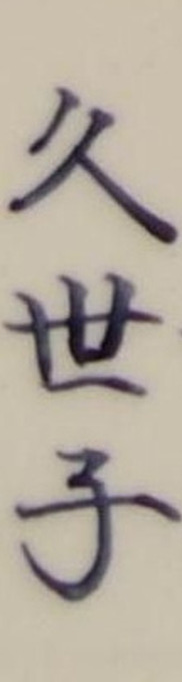久世子
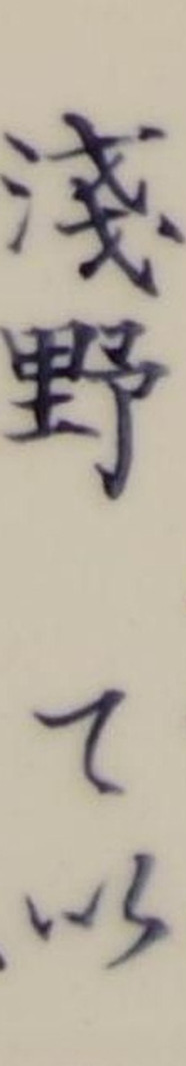浅野てい
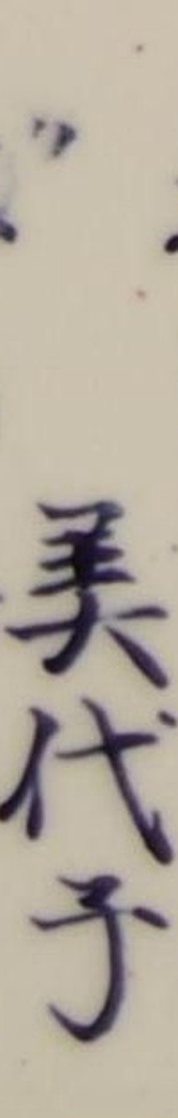美代子
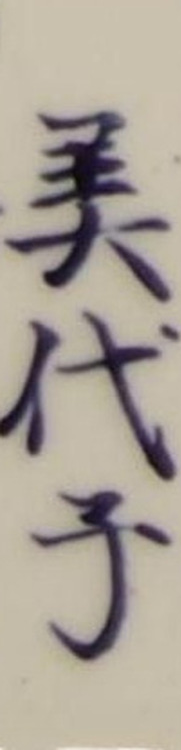美代子
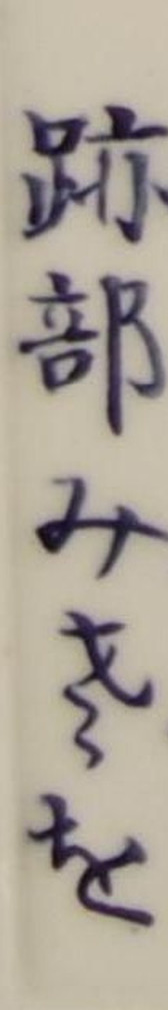跡部みさを

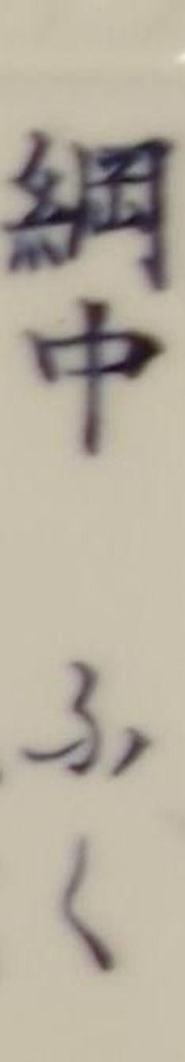網中ふく
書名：E~L
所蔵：高野山金剛峯寺
